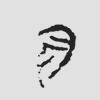朔
